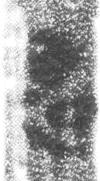申
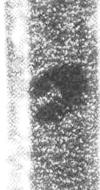㠯（以）
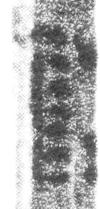監
